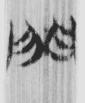門
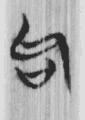句
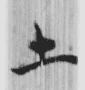土
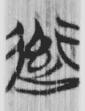{行糸止}
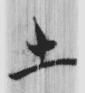土
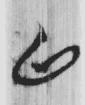㠯（以）
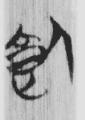飤
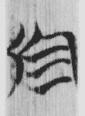於
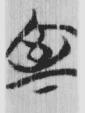室
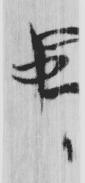𠁩
